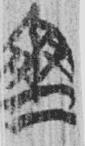齊
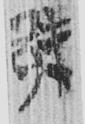邦
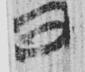日
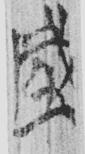城（盛）
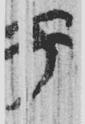于
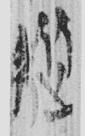緃（縱）
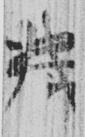弗
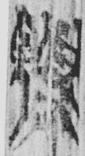○（顧）
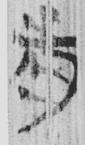前
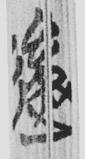○（後）
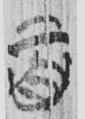百
